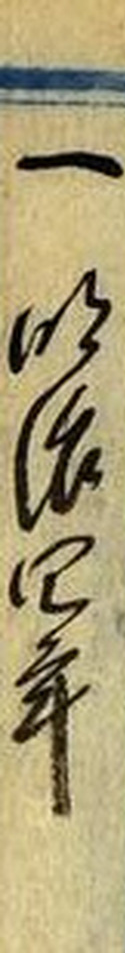一明治四年
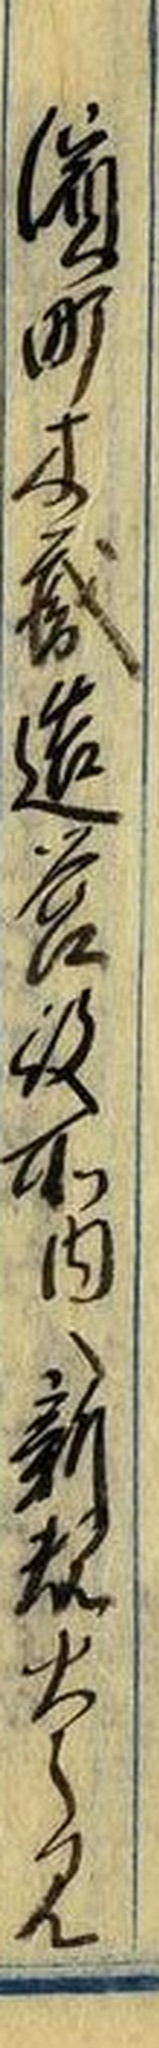浜町木蔵造営役所内へ新規火之見
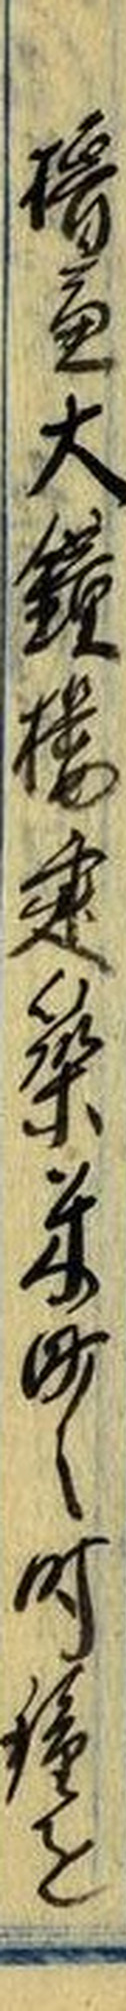櫓兼大鐘楼建築米町之時鐘を
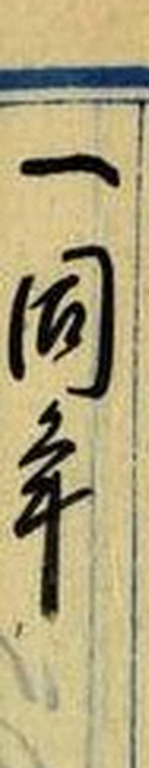一同年
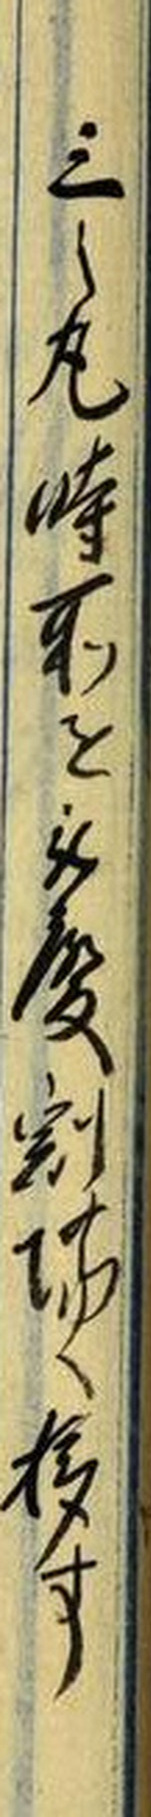三ノ丸時所を被廃割場へ移す
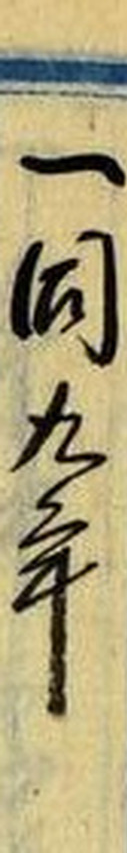一同九年
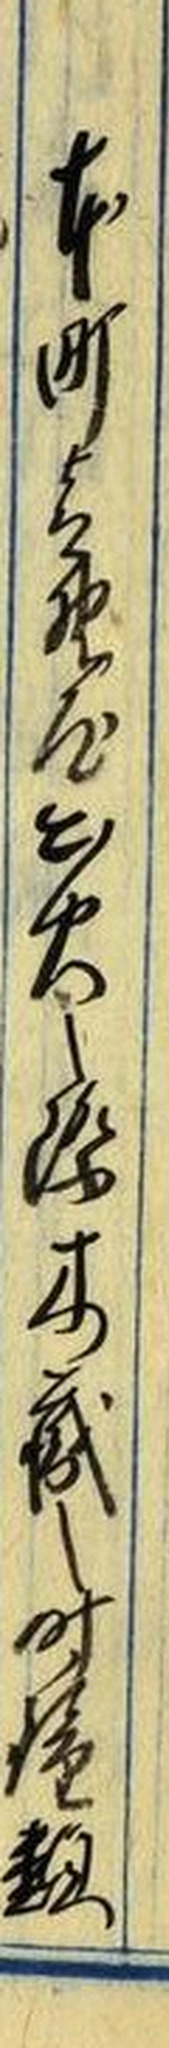本町青野屋出火之際木蔵之時鐘類
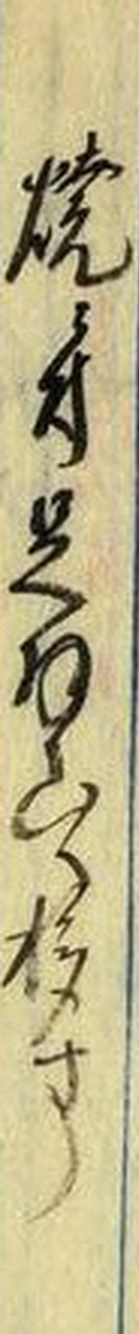焼に付足羽山へ移す
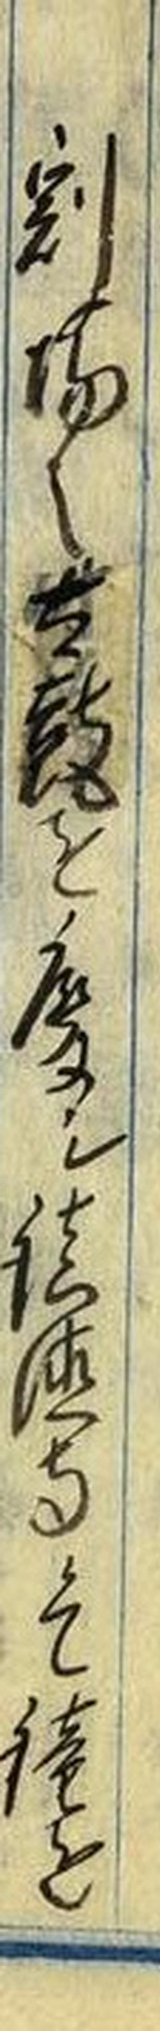割場之太鼓を廃し鎮徳寺にて鐘を
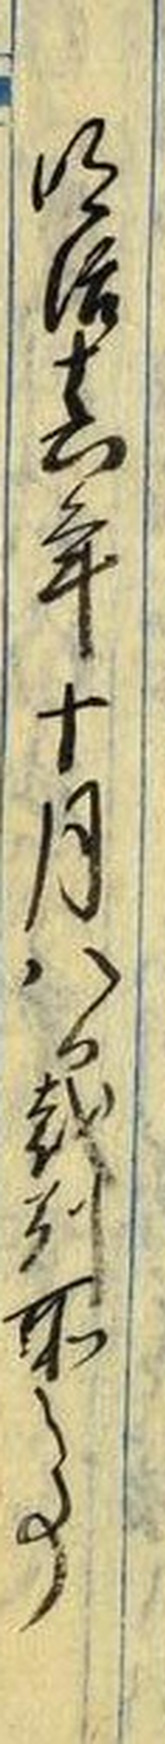明治十六年十月八日裁判所の事

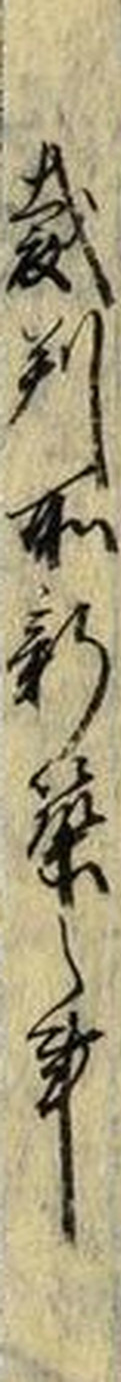裁判所新築之事
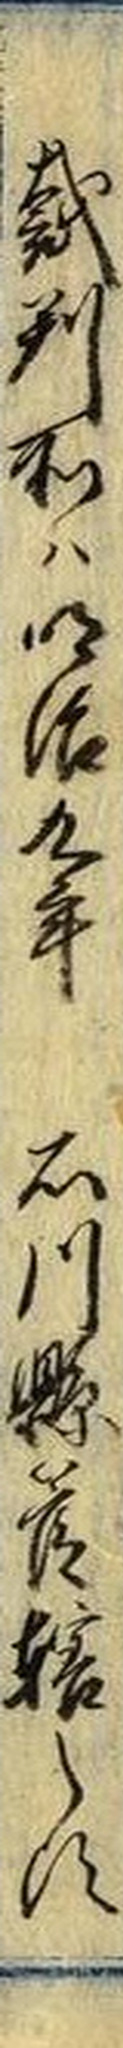裁判所は明治九年石川県管轄之頃
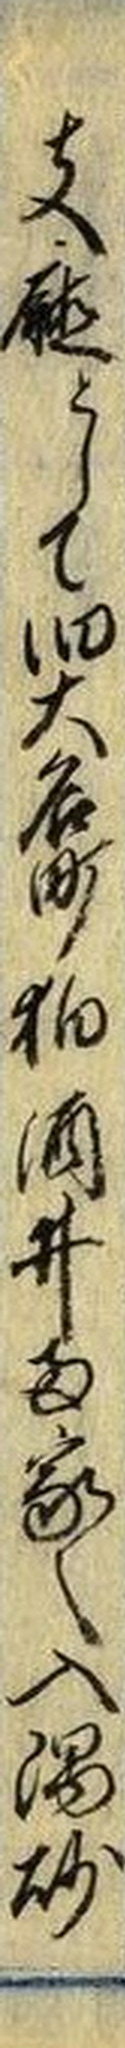支庁として旧大名町狛酒井両家之入隅砂
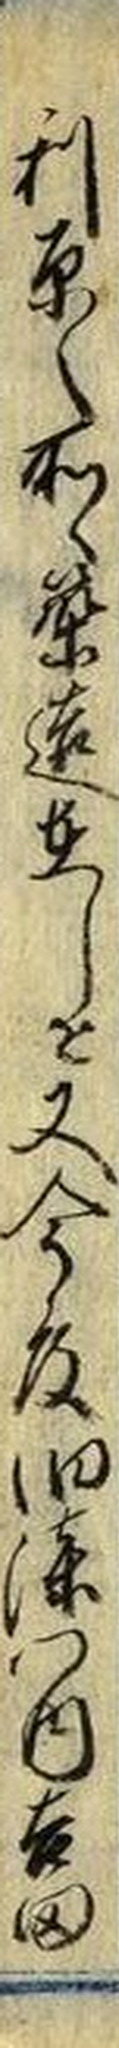利原之所へ築造在しを又今度旧漆門内吉田
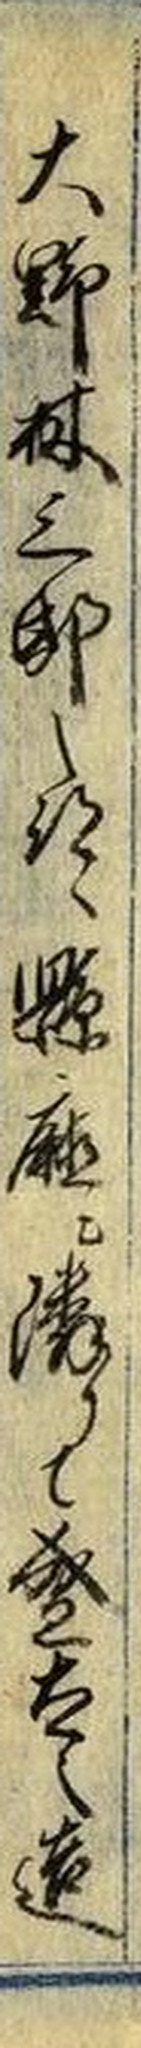大野林三邸之跡へ県庁に隣りて盛太之造
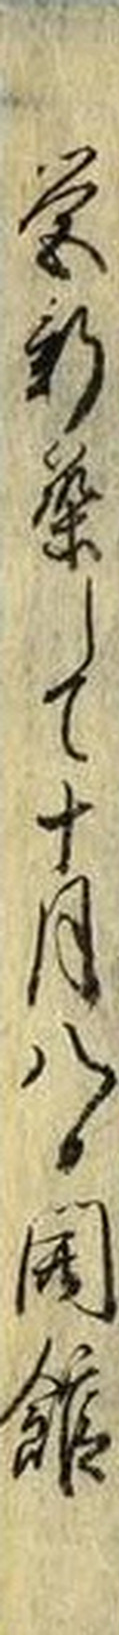営新築して十月八日開館
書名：温古集 五巻
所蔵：福井県文書館 Fukui Prefectural Archives
